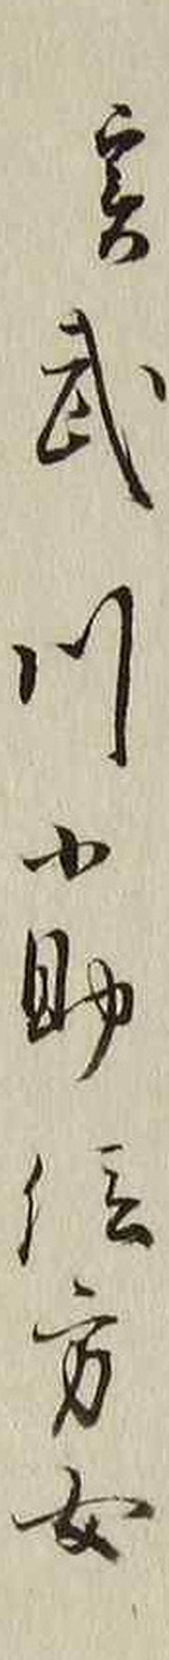実武川小助信方女
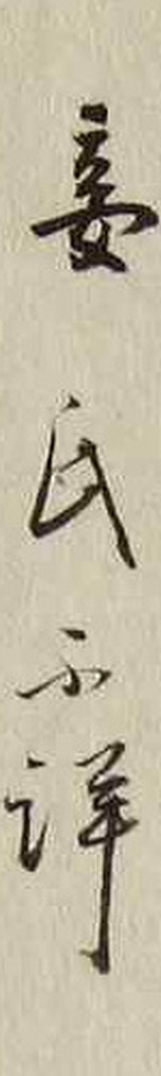妻氏不詳
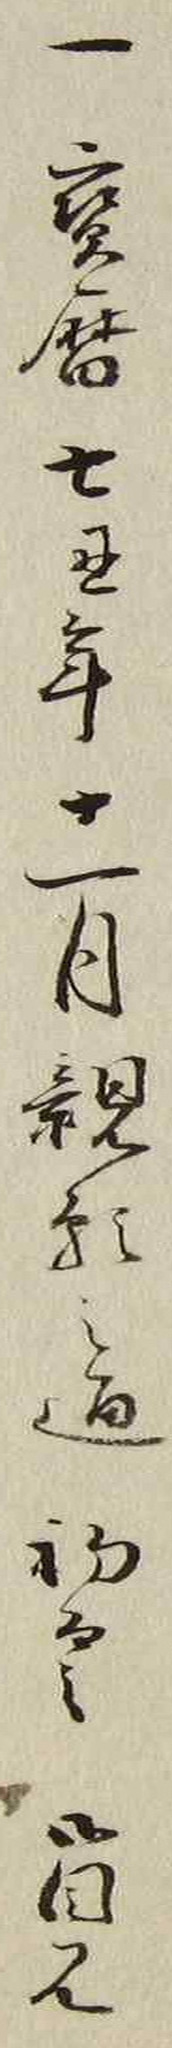一宝暦七丑年十一月親願之通初而之御目見
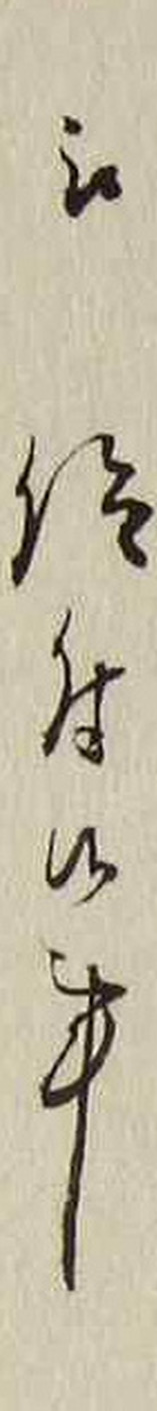被仰付候事
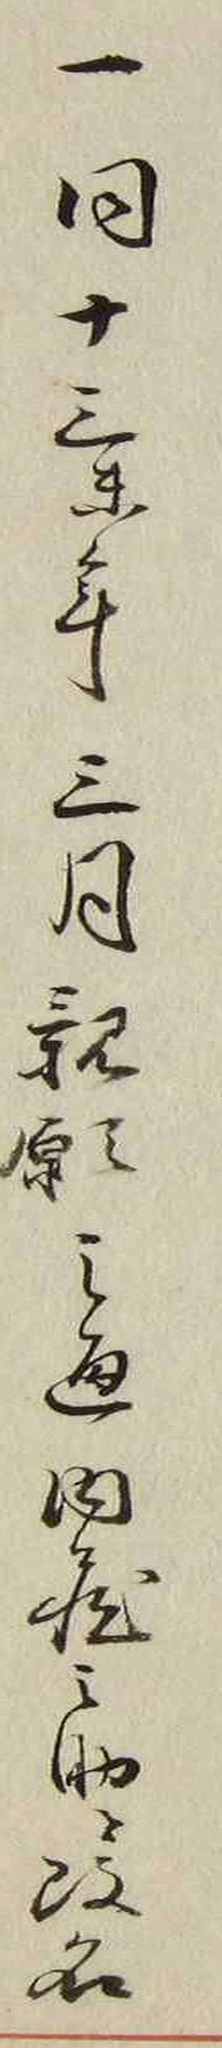一同十三未年三月親願之通内蔵之助と改名
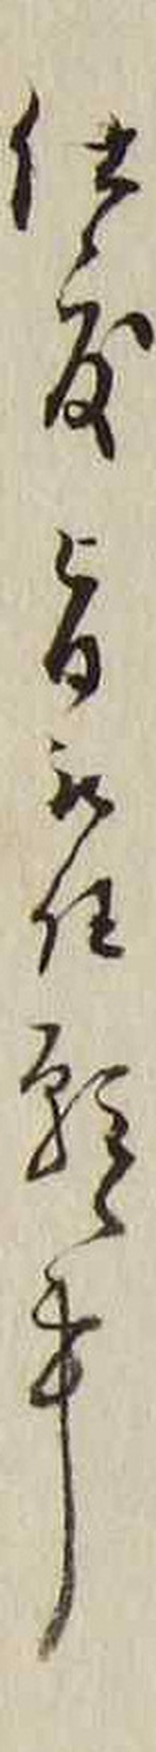仕度旨被任願候事
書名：諸士系譜　巻之14　い之部14
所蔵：会津若松市立会津図書館
